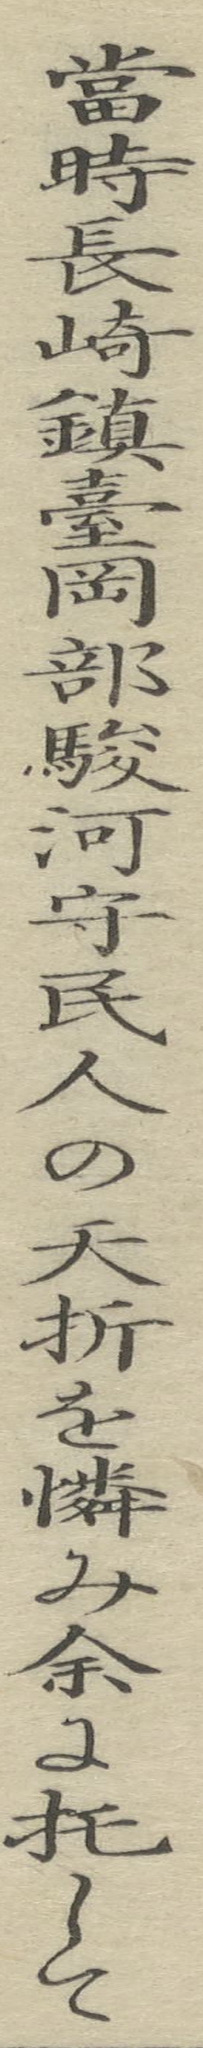當時長崎鎮臺岡部駿河守民人の夭折を憐み余に託して
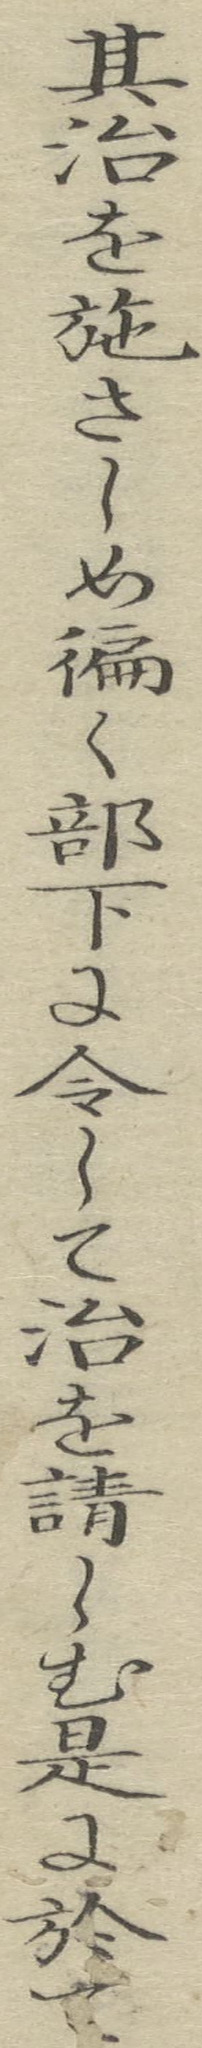其治を施さしめ徧く部下に令して治を請しむ是に於て
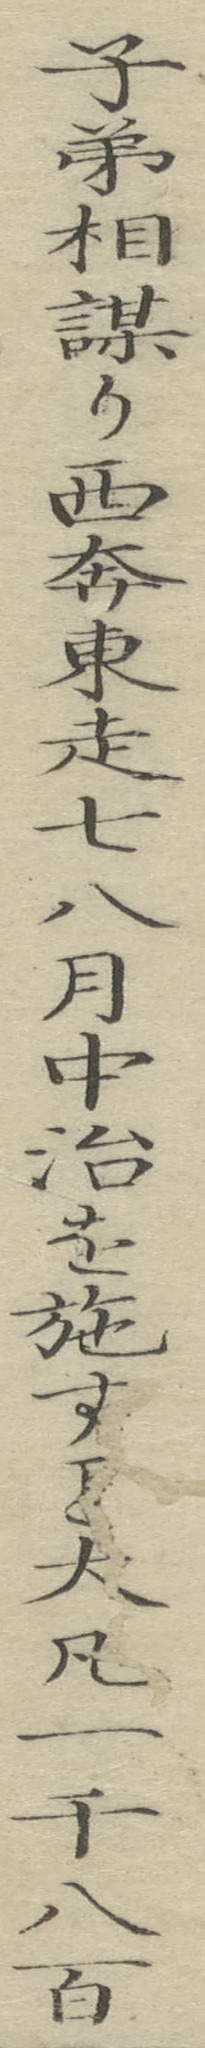子弟相謀り西奔東走七八月中治を施すこと大凡一千八百
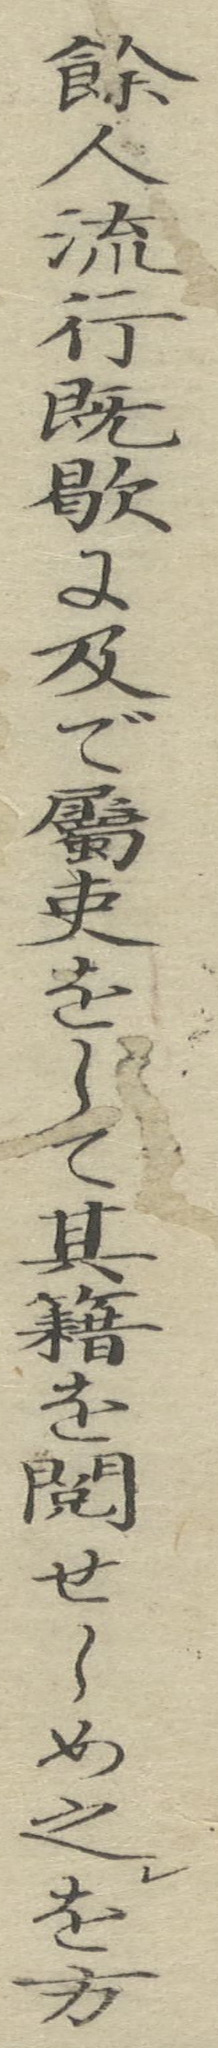餘人流行既歇に及で屬吏をして其籍を閲せしめ之方
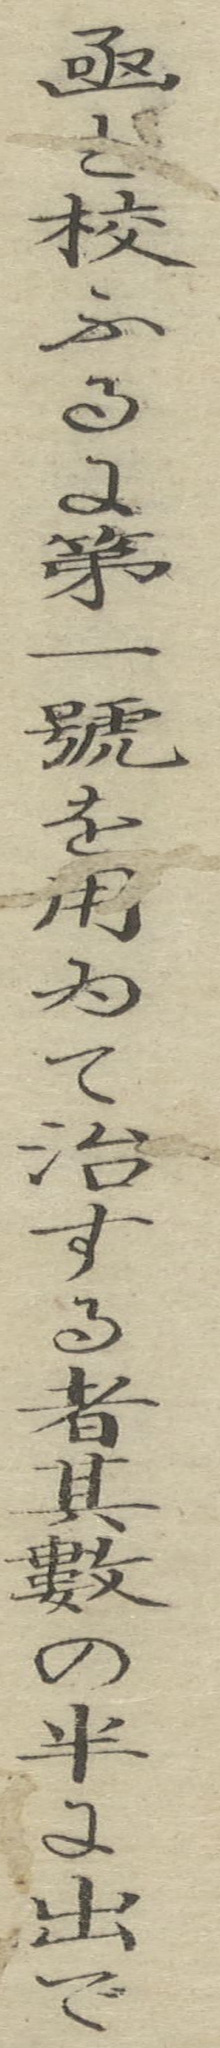函こと校ふるに第一號を用ゐて治する者其數の半に出で
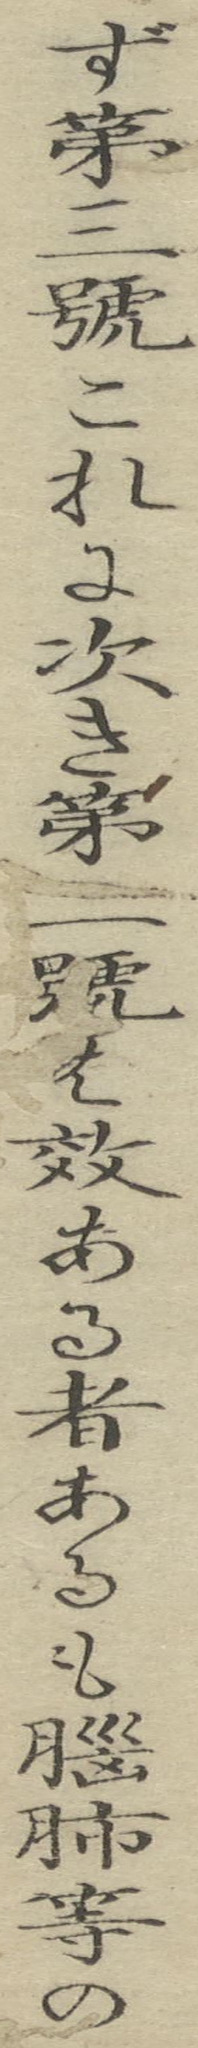ず第三號これに次き第二號は効ある者あるも脳肺等の

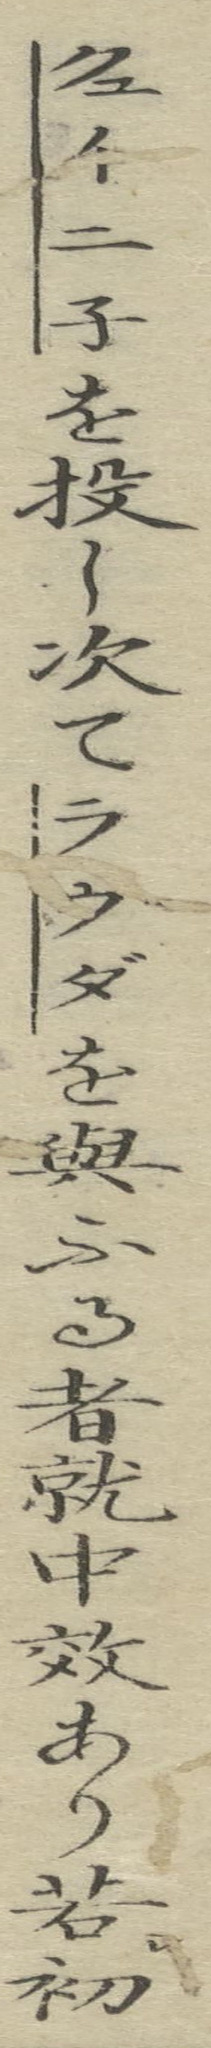クュイニネを投し次てラウダを與ふる者就中効あり若初
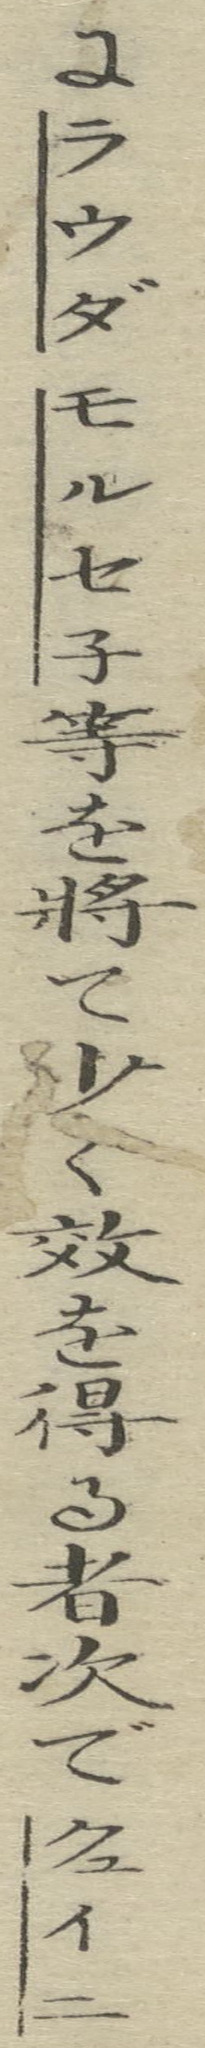にラウダモルセイ等を將て少く効を得る者次でクュイニ
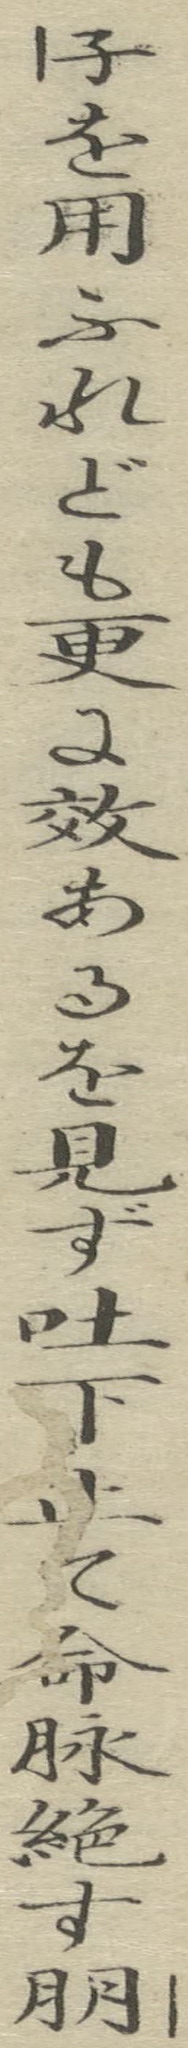ネを用ふれども更に効あるを見ず吐下止て命脉絶す朋
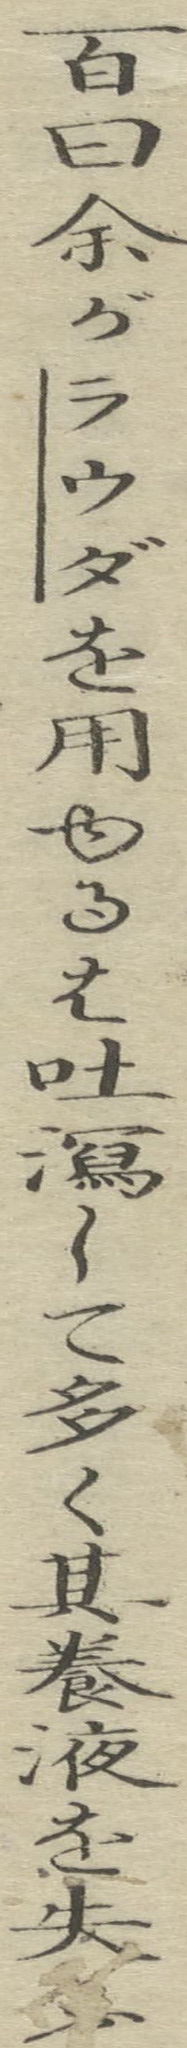百曰余がラウダを用ゐるは吐瀉して多く其養液を失ふ
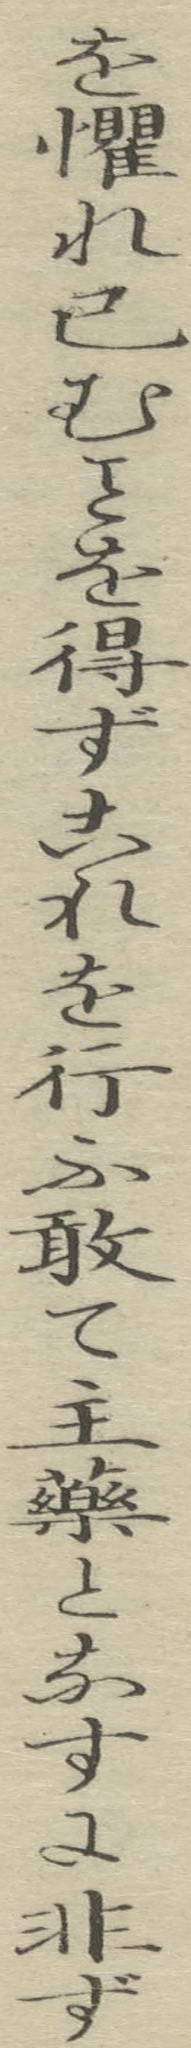を惧れ己むことを得ずこれを行ふ敢て主藥となすに非ず
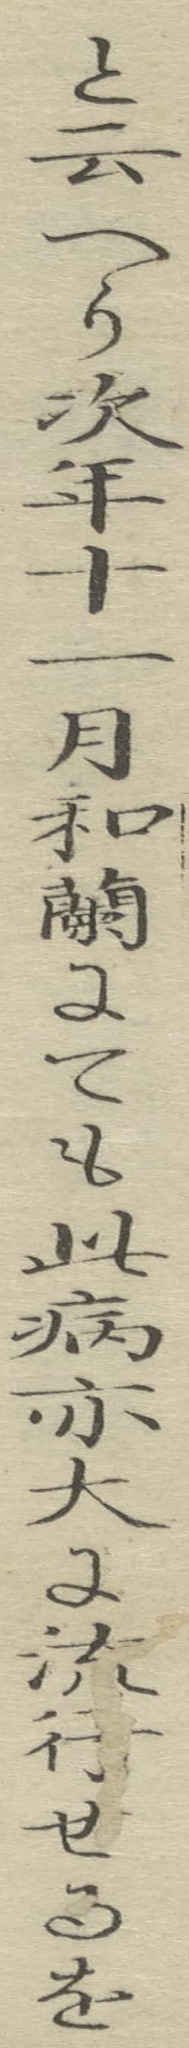と云へり次年十一月和蘭にても此病亦大に流行せるを
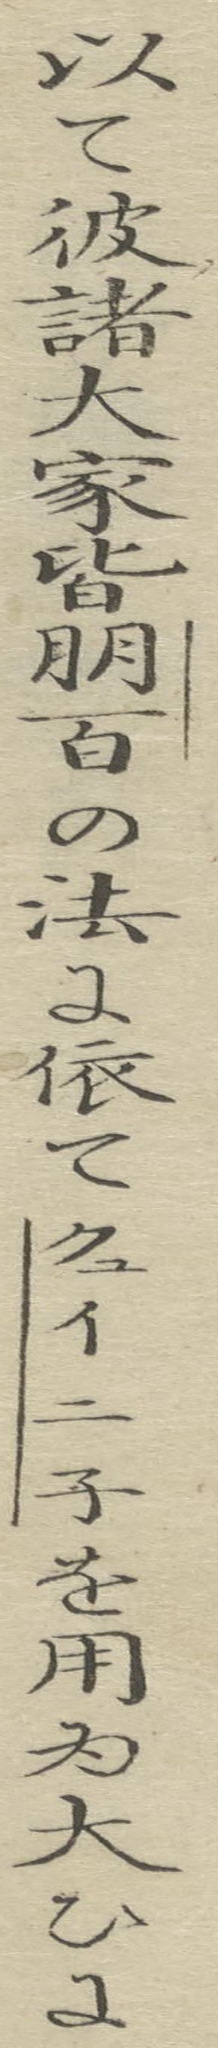以て彼諸大家皆朋百の法に依てクュイニネを用ゐ大ひに
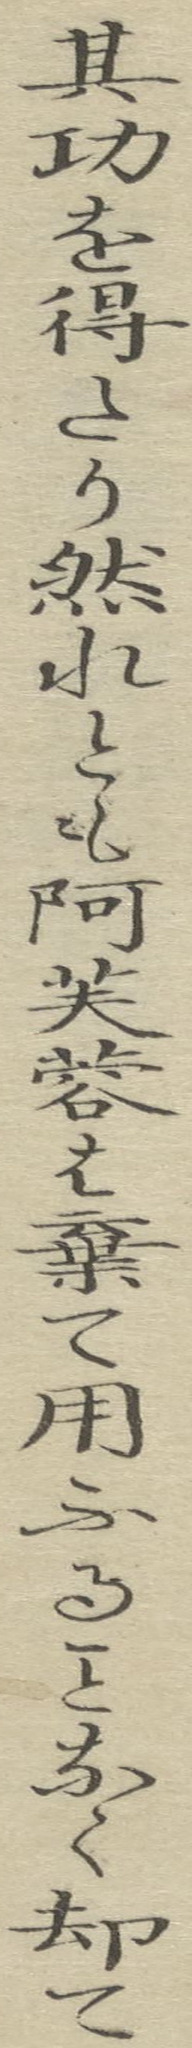其功を得たり然れとも阿芙蓉は棄て用ふることなく却て
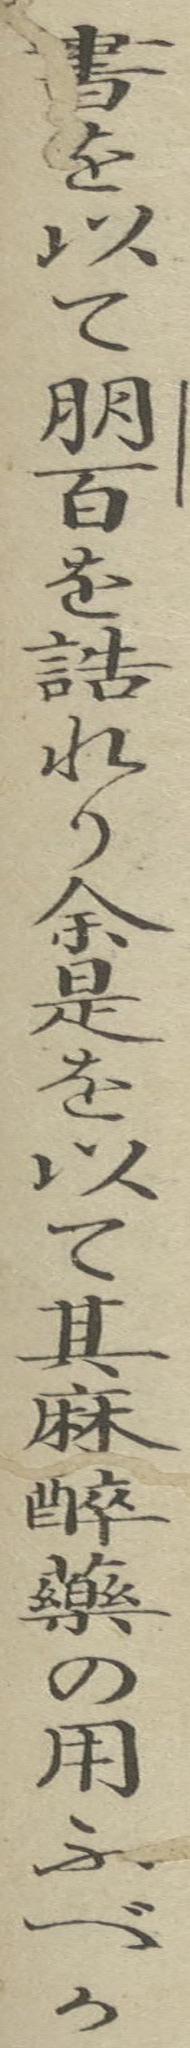書を以て朋百を誥れり余是を以て其麻酔藥の用ふべか
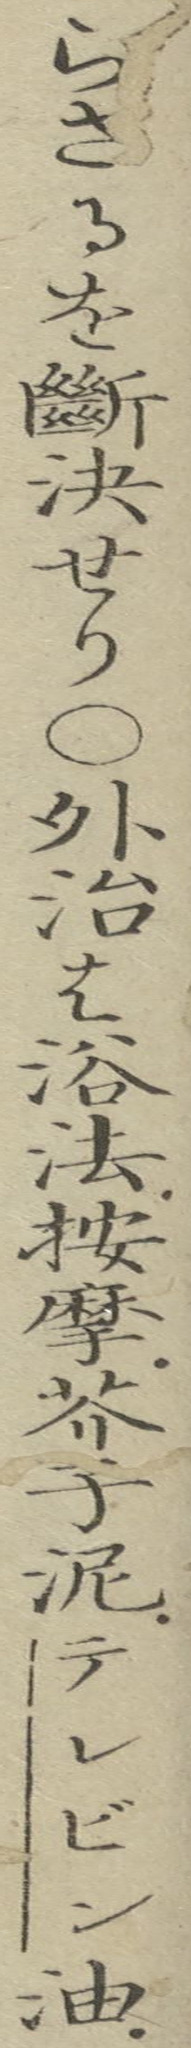らさるを断決せり〇外治は浴法、按摩、芥子泥、テレビン油、
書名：官版疫毒預防説　全
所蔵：東京大学総合図書館 General Library in the University of Tokyo, JAPAN
